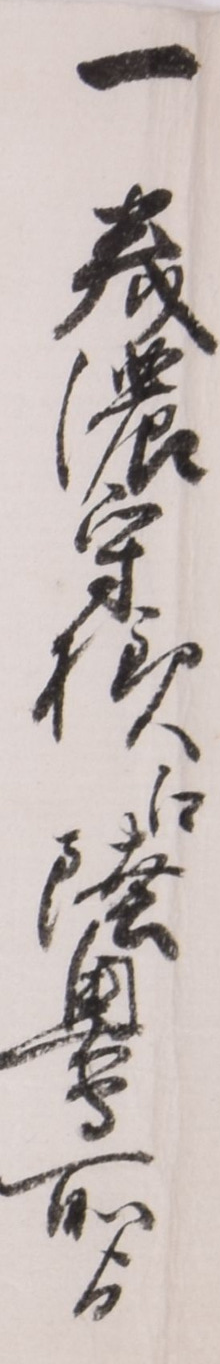一美濃守様江陸奥守所ゟ
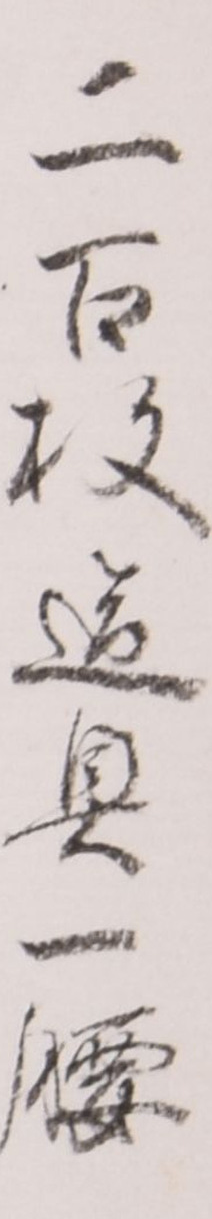二百枚送具一腰
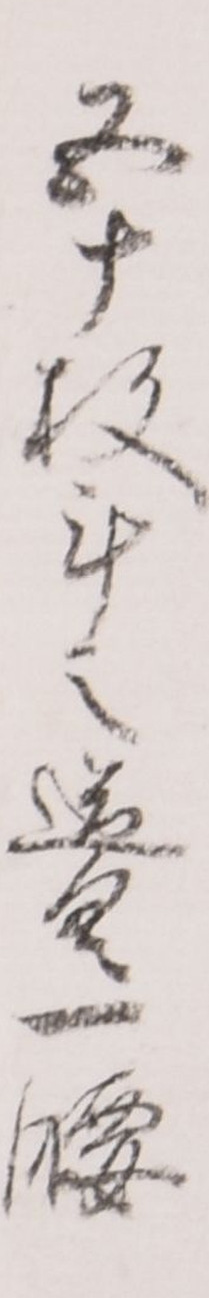五十枚斗之送具一腰
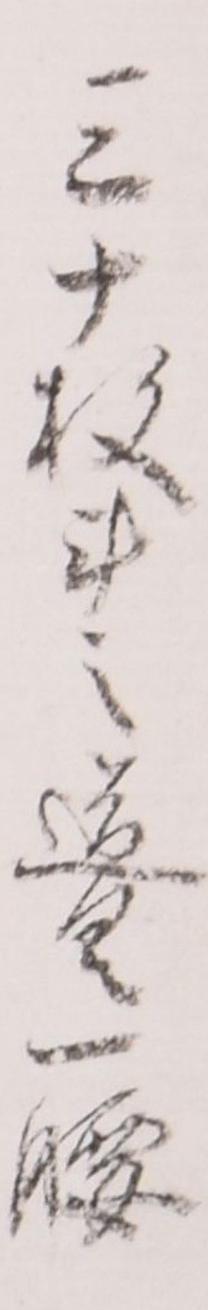三十枚斗之送具一腰
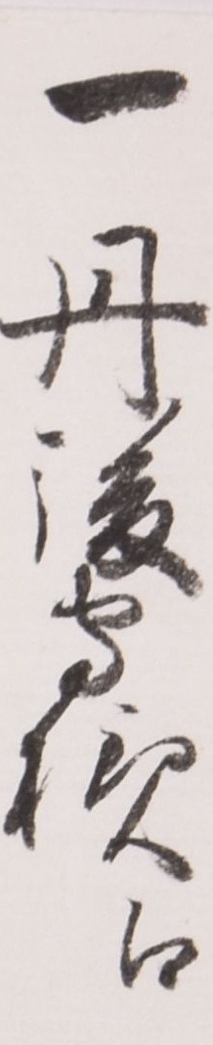一丹後守様江
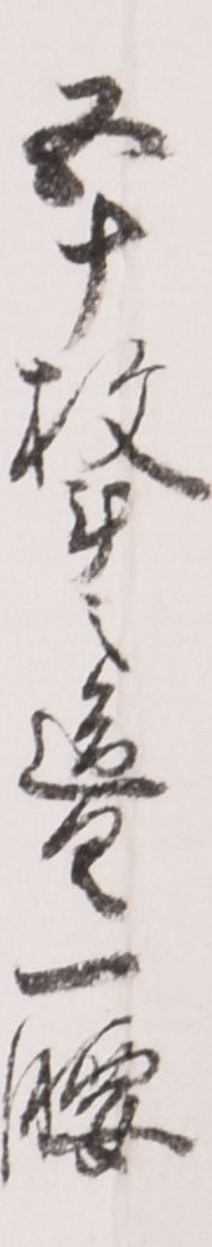五十枚斗之送具一腰
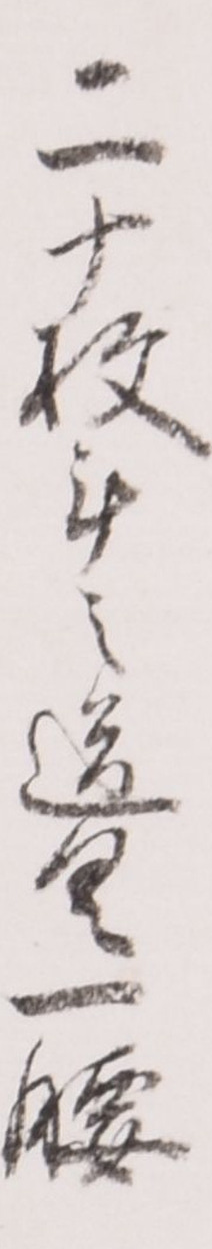二十枚斗之送具一腰
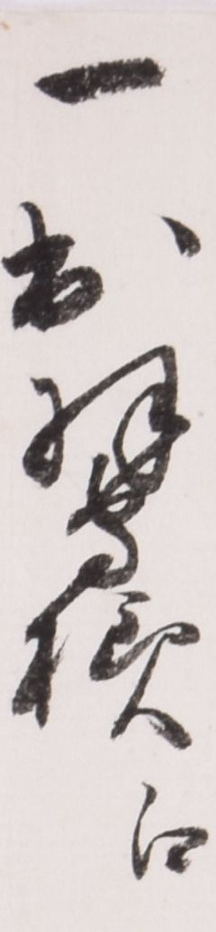一出羽守様江
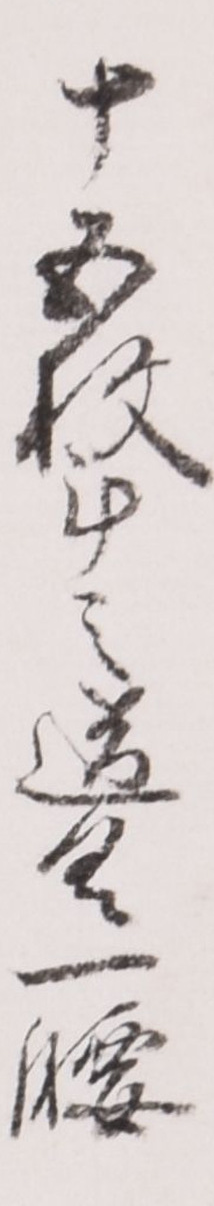十五枚斗之送具一腰
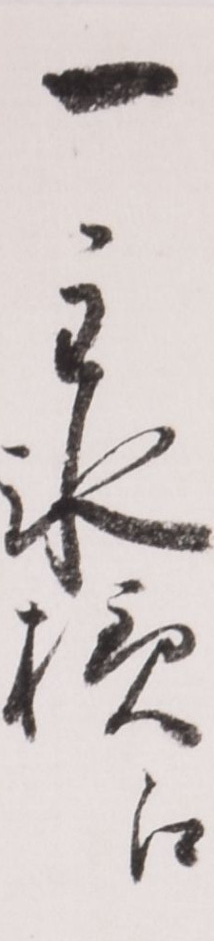一主水様江
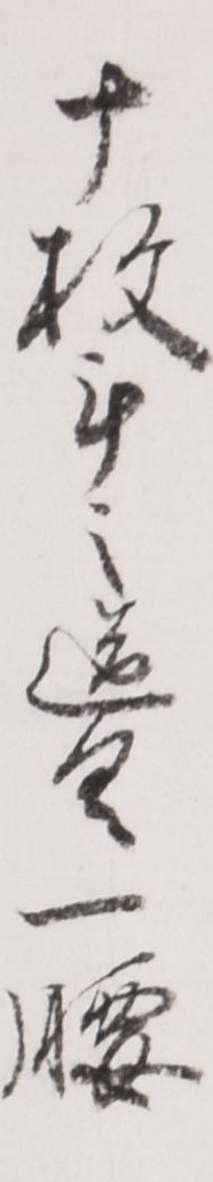十枚斗之送具一腰
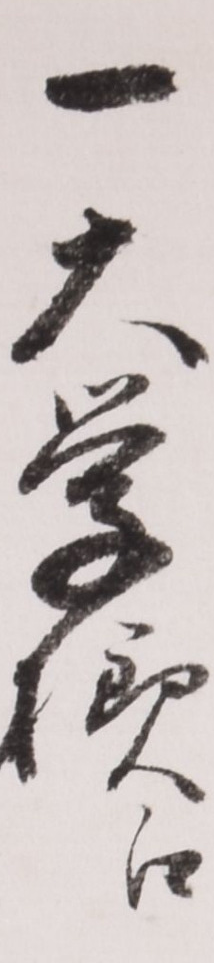一大学様江
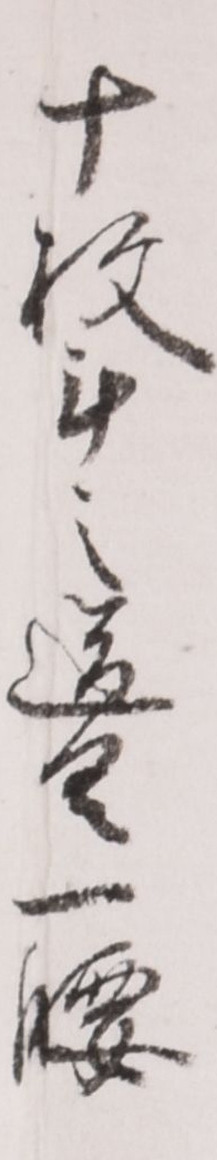十枚斗之送具一腰
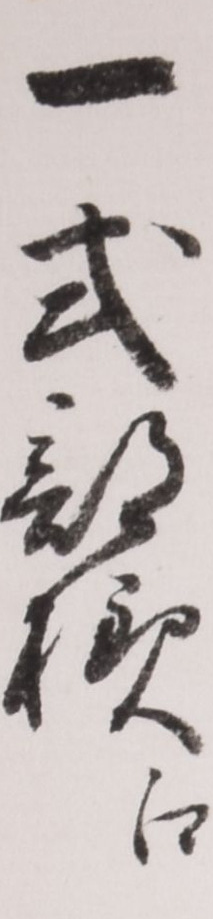一式部様江
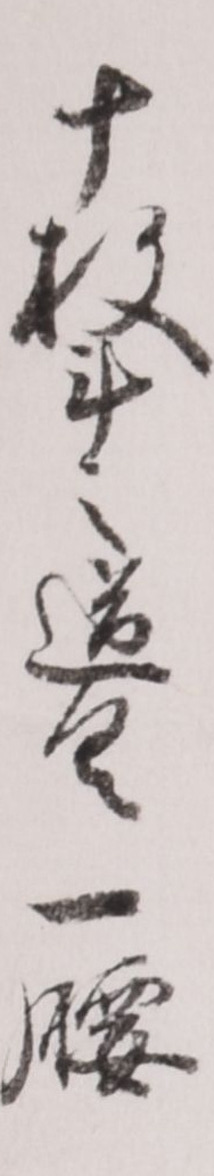十枚斗之送具一腰
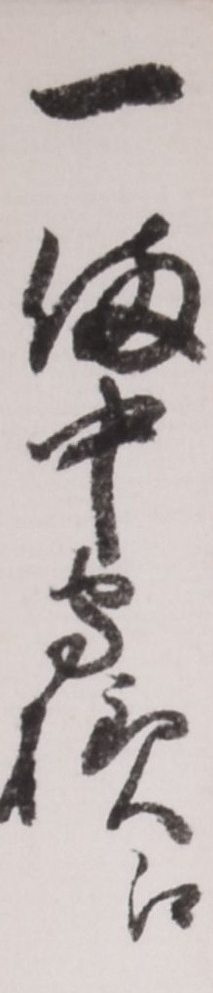一備中守様江
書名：覚（「一　美濃守様江陸奥守前より〜」
